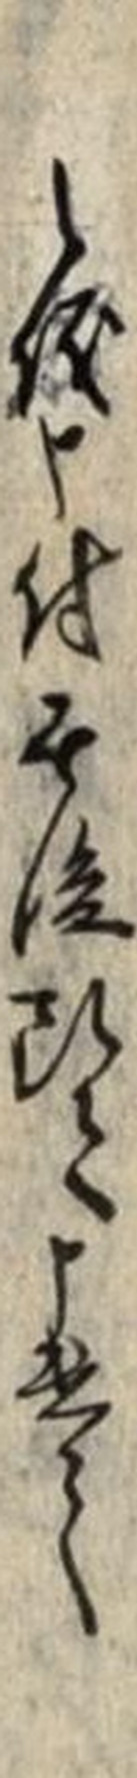之儀申付其後頭々へ申遣之
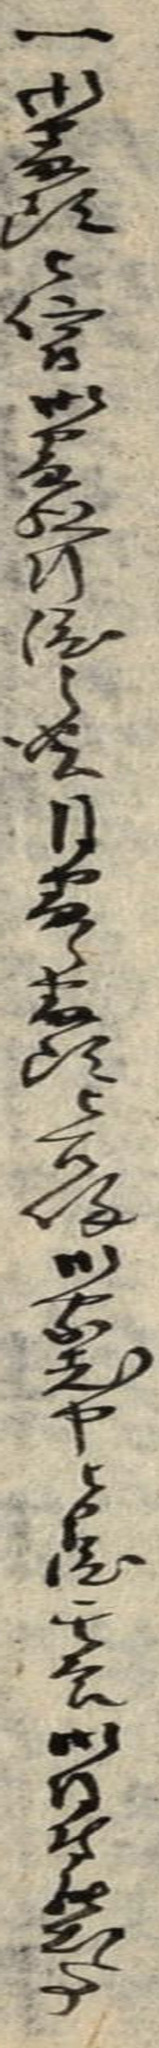一御番頭被仰付御番組引渡之儀は月番へ番頭被召呼御家老中被申渡其節御目付罷出候事
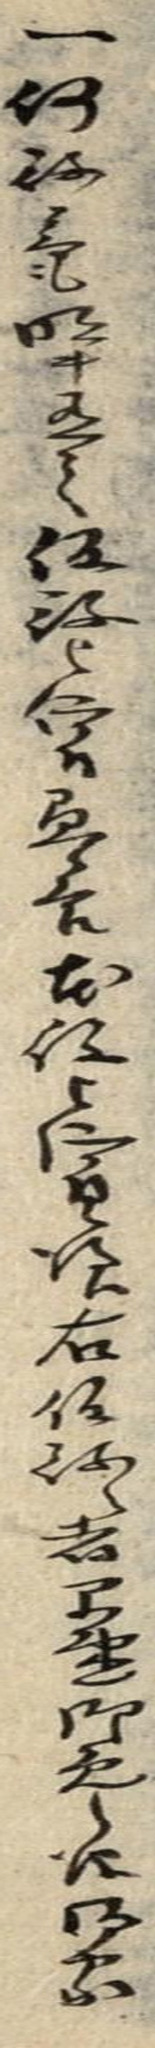一何役に而も明キ有之仮役被仰付置候節本役被仰付候得は右仮役之者早速御免之儀御家
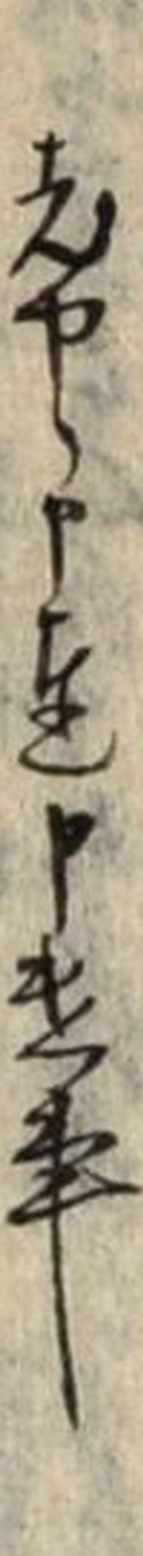老中へ申達申遣候事
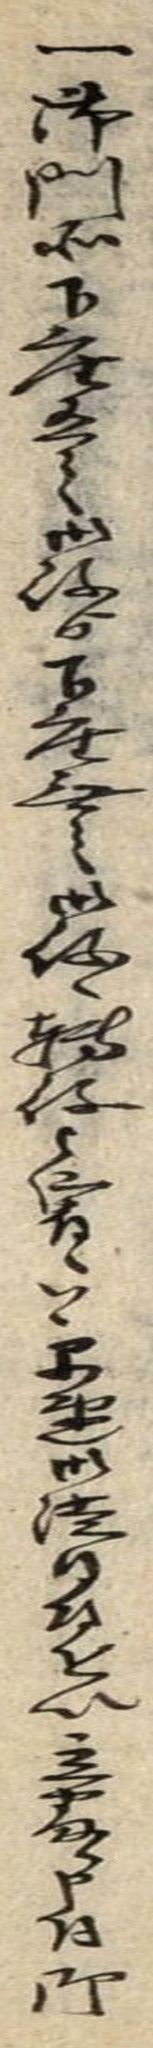一御門所下座有之御役ゟ下座無之御役へ転役被仰付候はゝ早速御徒目付を以立番へ申付御
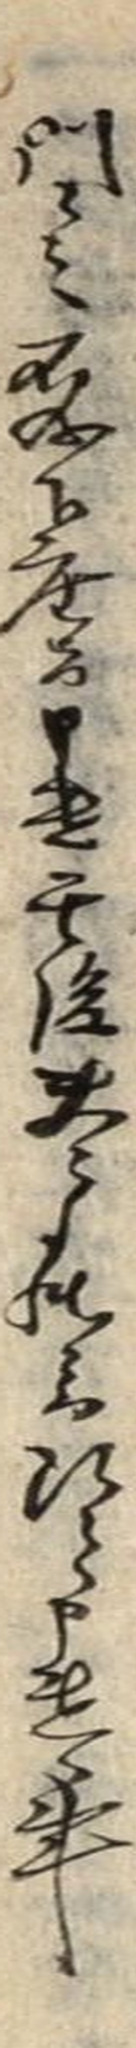門〳〵へ不及下座旨申遣其後夫々手紙に而頭々へ申遣候事
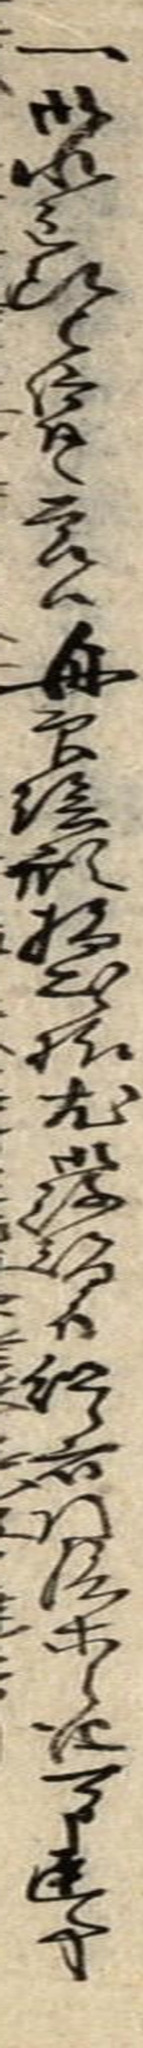一御水主頭被仰付候節は舟印絵形指出候様尤御役替に付組之者引渡等之儀可申達事
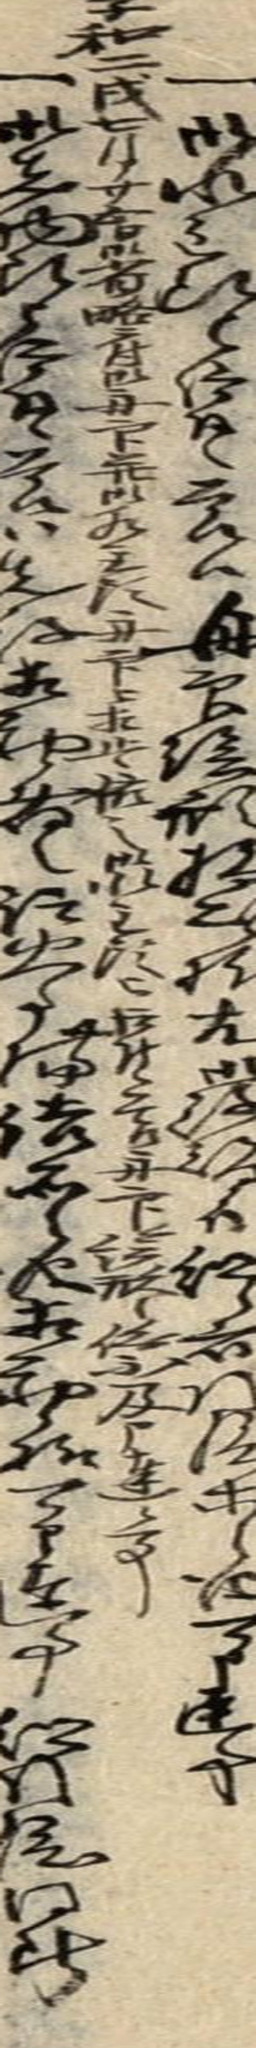一御先物頭被仰付候節は先役相勤候者之跡火事場詰所之儀相勤候様可申達事組引渡同断
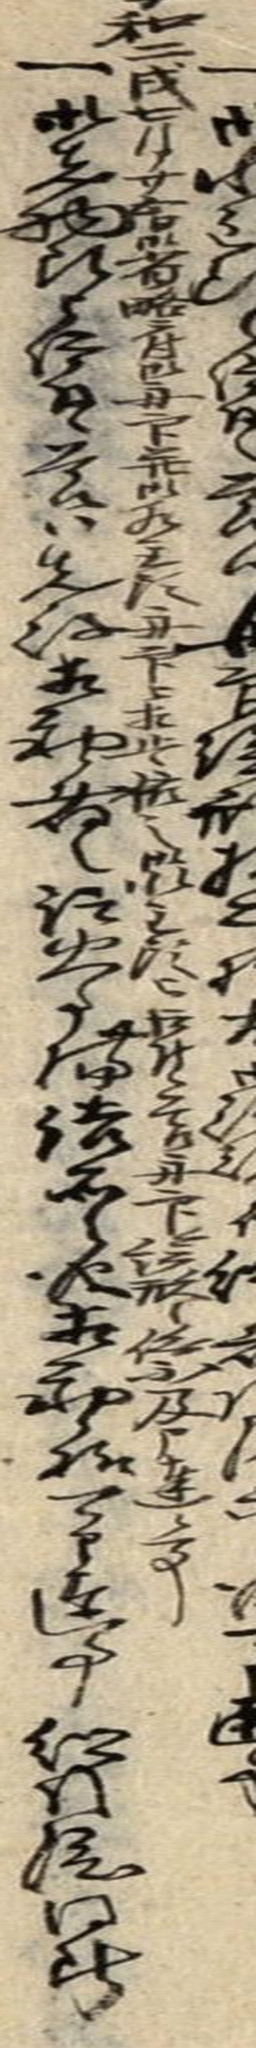一御先物頭被仰付候節は先役相勤候者之跡火事場詰所之儀相勤候様可申達事組引渡同断
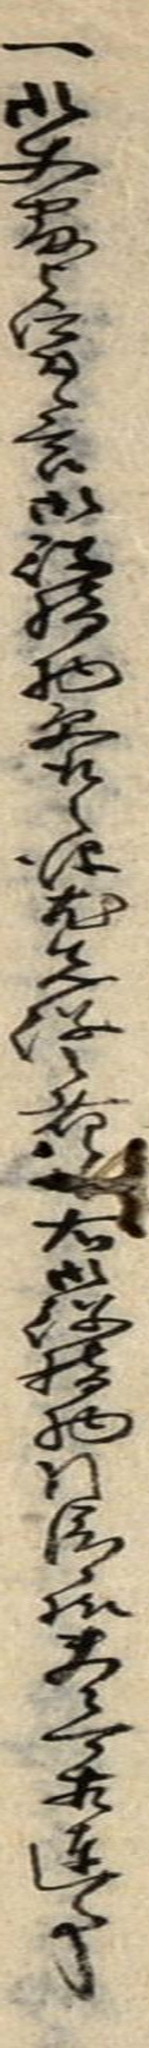一御使番被仰付候節御役指物受取候儀尤先役之者右御役指物引渡候様夫々可相達事
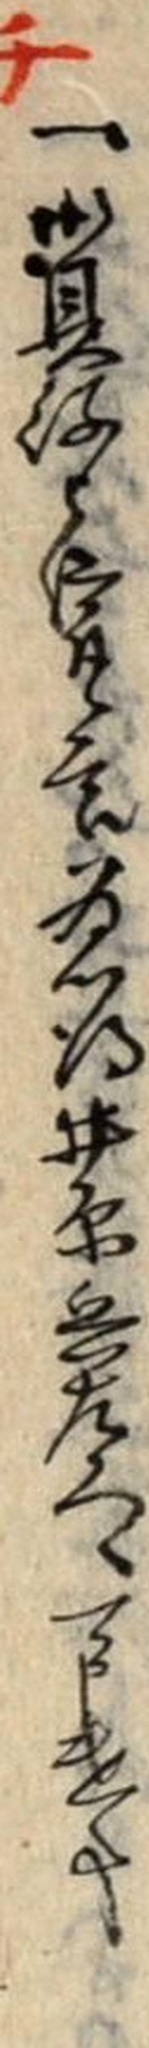一御具役被仰付候節為心得井原兵左衛門へ可申遣事

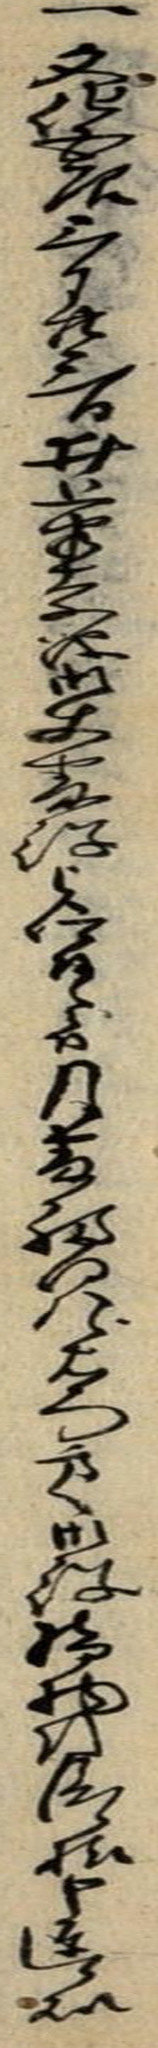一文化五辰三月廿三日井上半太夫儀御使番役被仰付候に付月番福田八郎右衛門方へ御役指物引渡候様申達候処
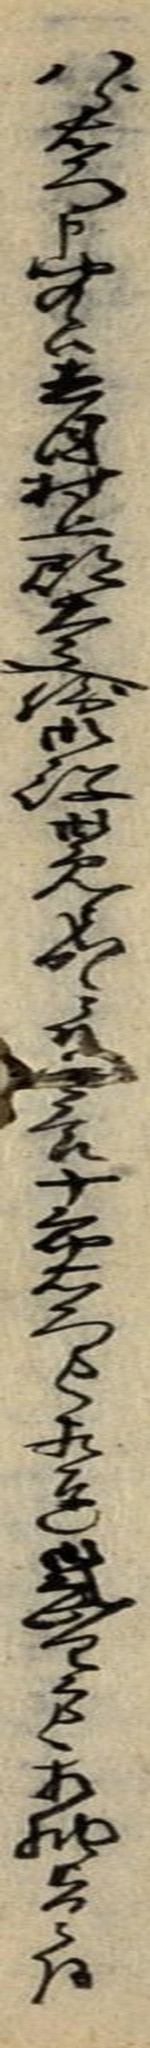八郎右衛門申聞候は去月村上郡太夫儀御役御免被成候に付其節十郎右衛門方へ相達御武具方へ相納旨に付
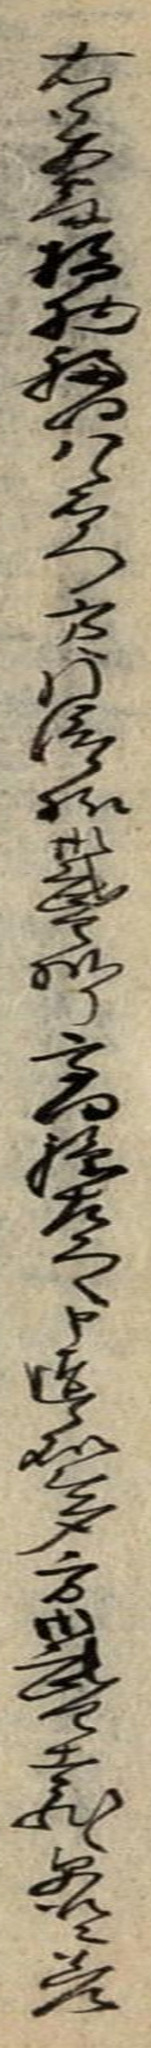右御使番指物福田八郎右衛門方へ引渡候様御武具掛り高田孫左衛門へ申達候処今夕方御武具土蔵へ受取に差
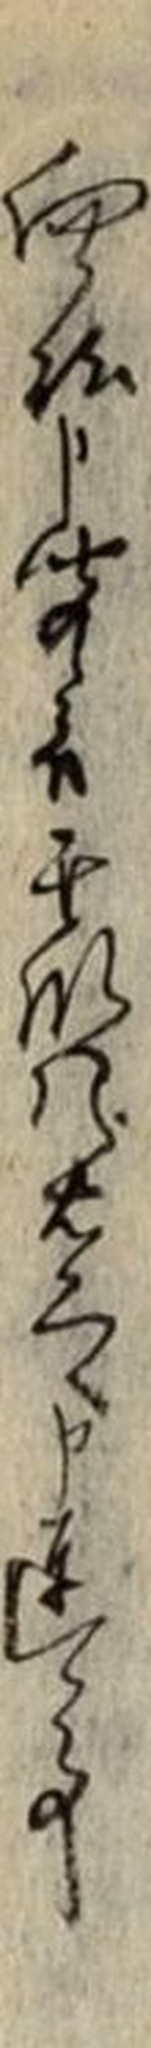向候様申聞候に付其段八郎右衛門へ申達候事
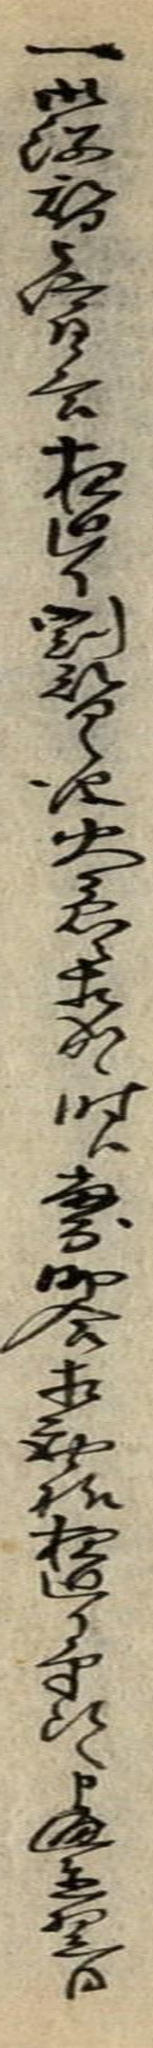一御役替被仰付候節夜廻り割替之儀火急に相成候時は当分助合相勤候様夜廻り筆頭へ申通置翌日
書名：御用并被仰出之部
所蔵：福井県文書館 Fukui Prefectural Archives
